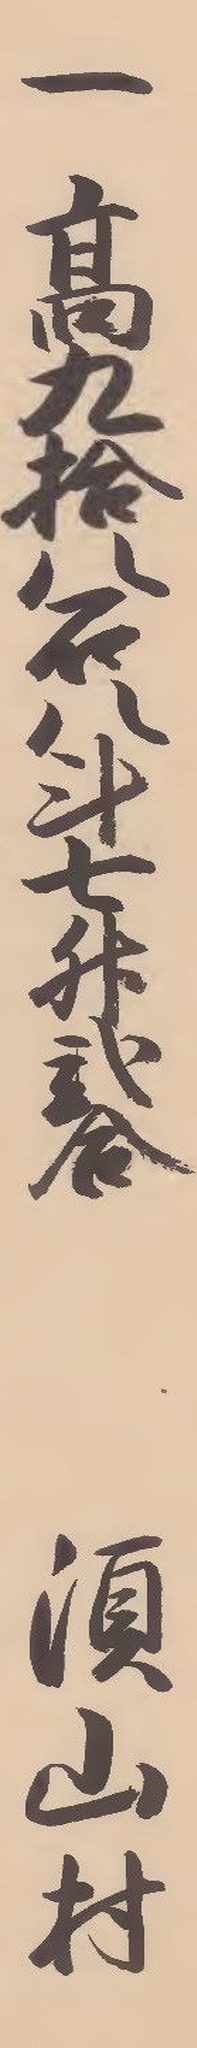一高九拾八石八斗七升弐合須山村
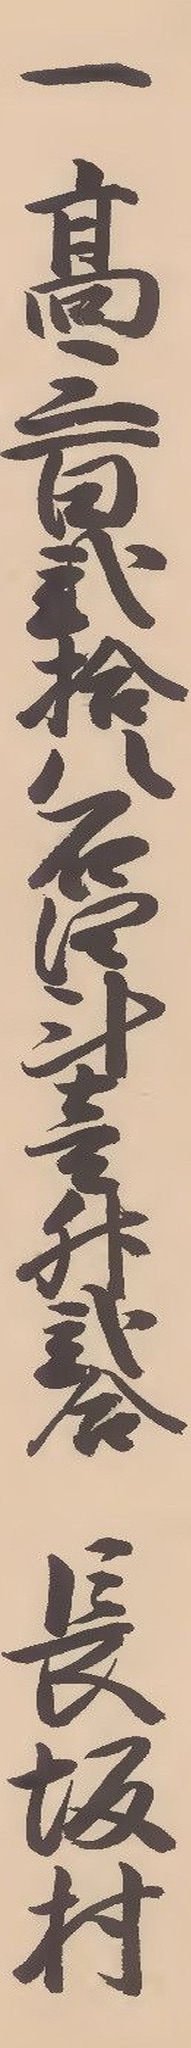一高三百弐拾八石四斗壱升弐合長坂村
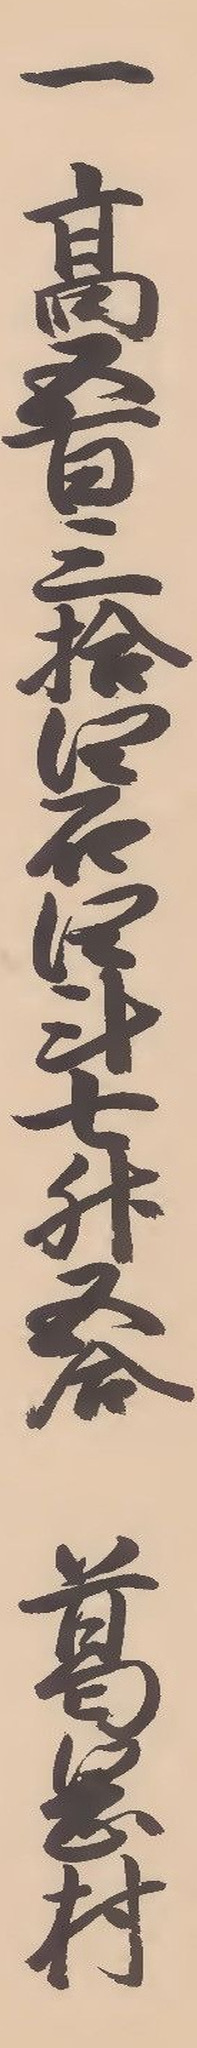一高五百三拾四石四斗七升五合葛岡村
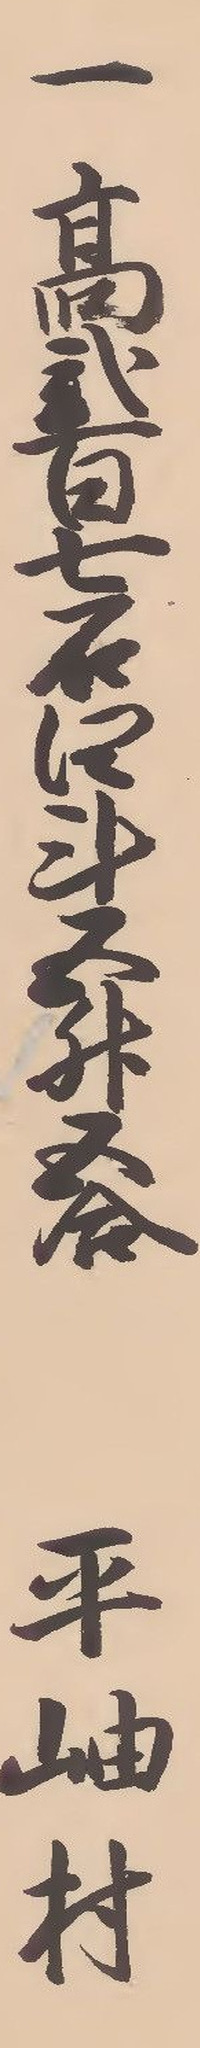一高弐百七石四斗五升五合平岫村
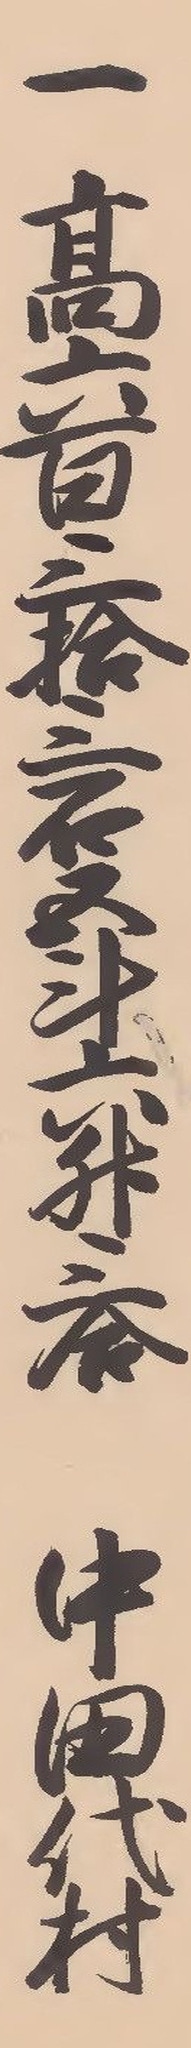一高六百三拾三石五斗六升三合中田代村
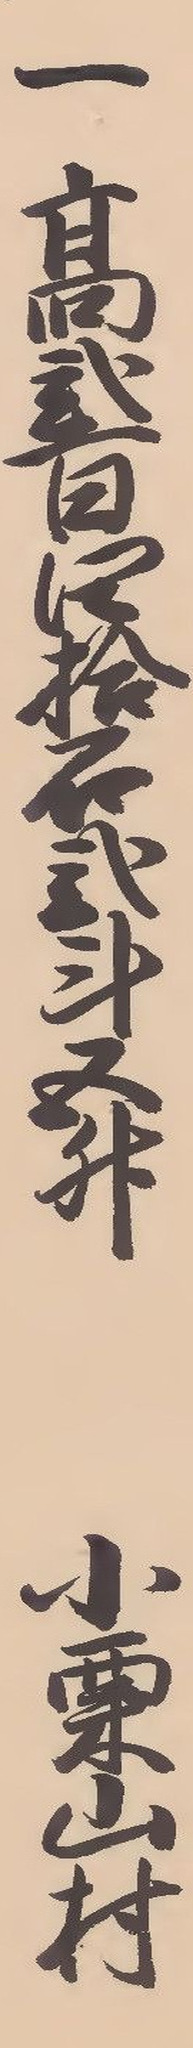一高弐百四拾石弐斗五升小栗山村
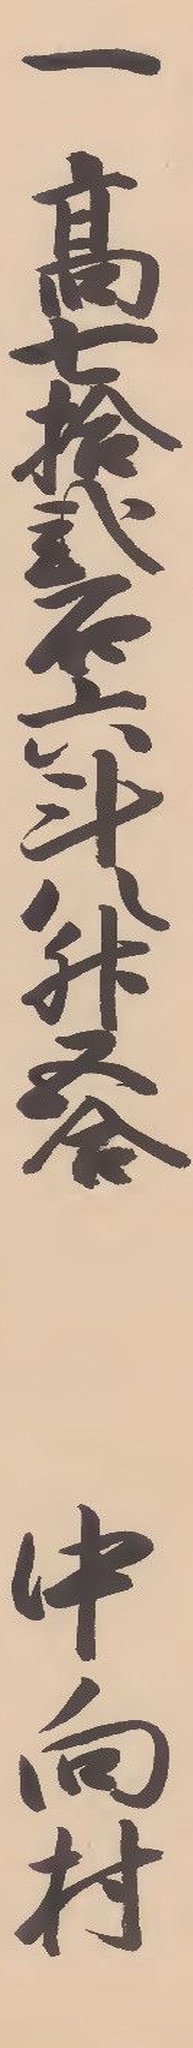一高七拾弐石六斗八升五合中向村
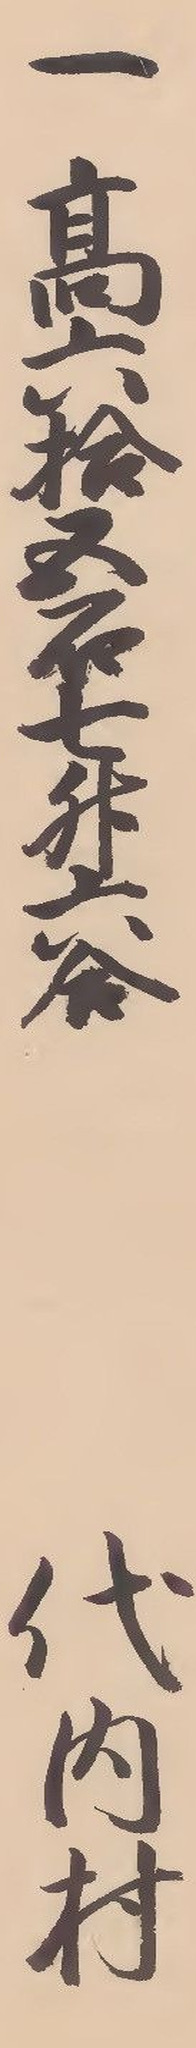一高六拾五石七升六合代内村

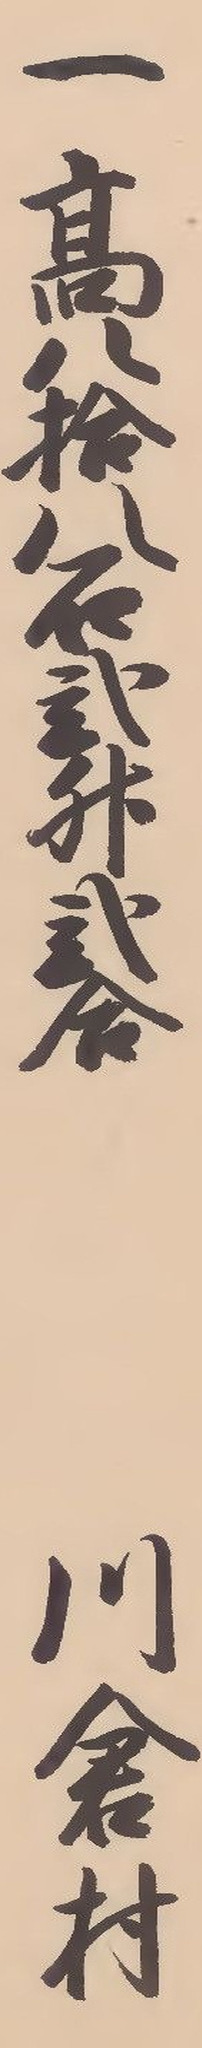一高八拾八石弐升弐合川倉村
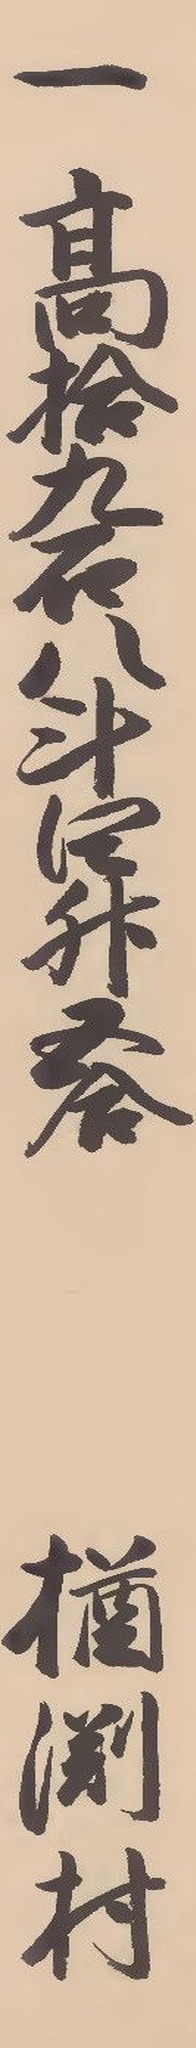一高拾九石八斗四升五合猶淵村
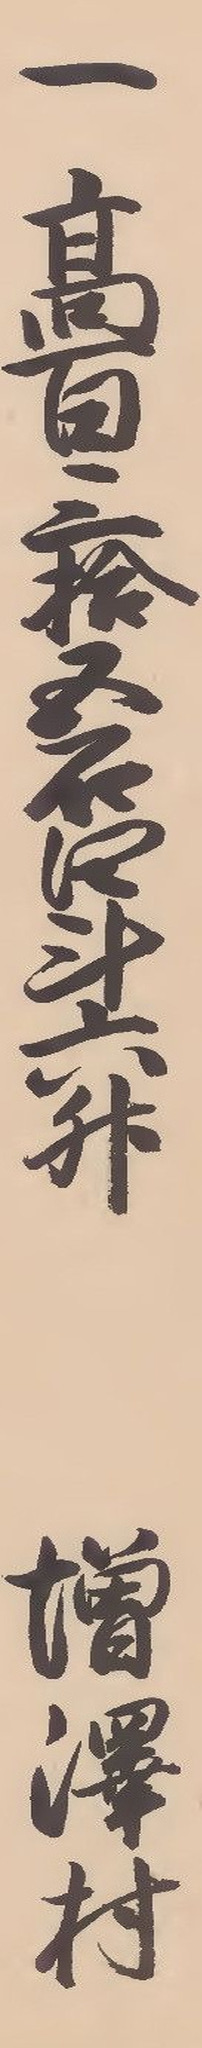一高百三拾五石四斗六升増沢村
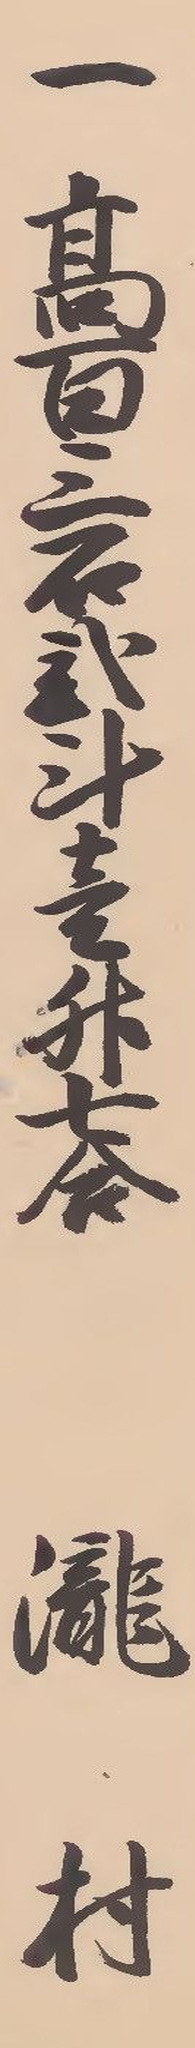一高百三石弐斗壱升七合滝村
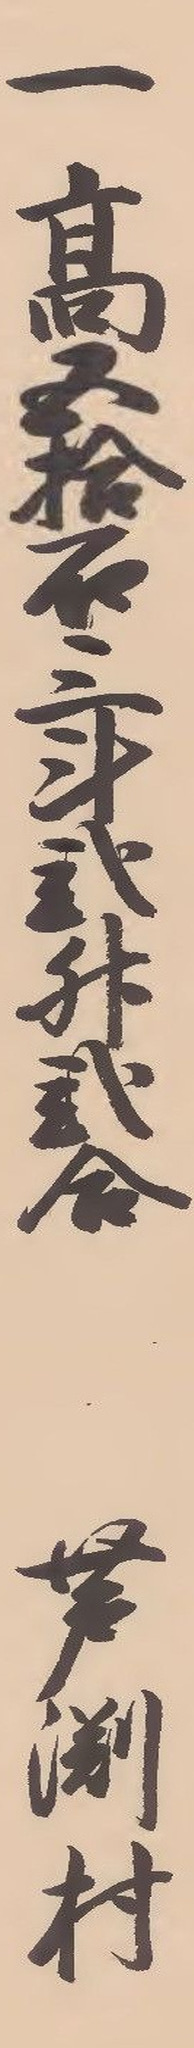一高五拾石三斗弐升弐合芦淵村
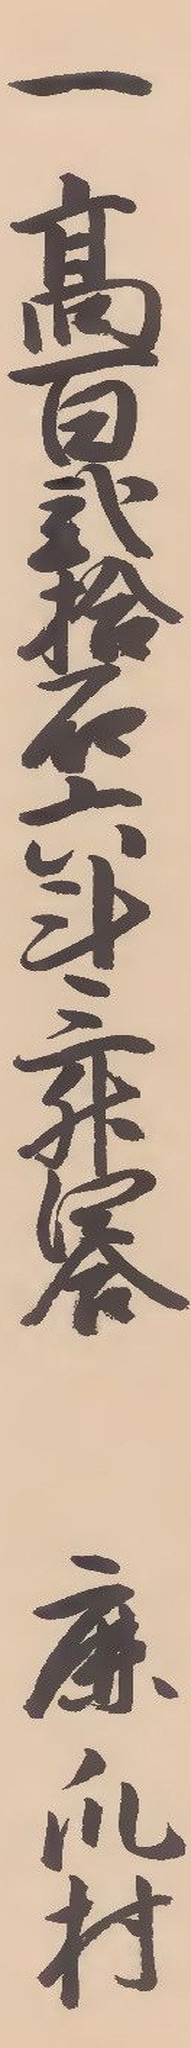一高百弐拾石六斗三升四合鹿爪村
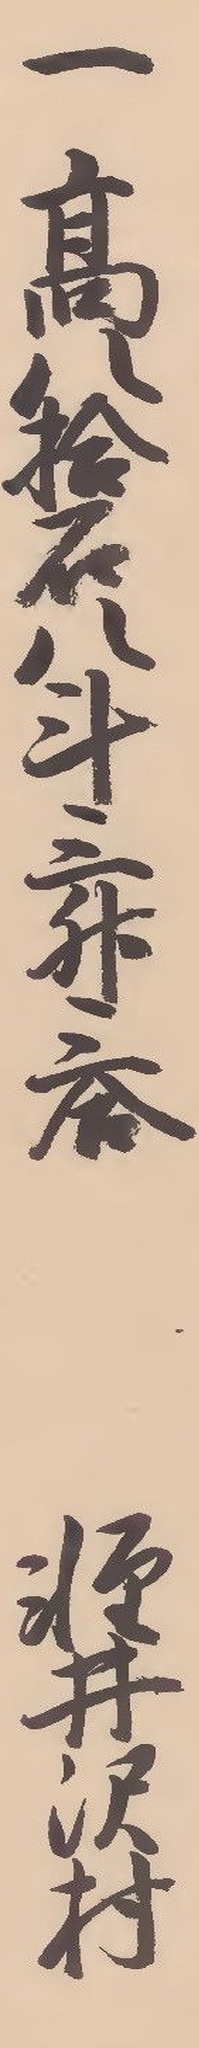一高八拾石八斗三升三合軽井沢村

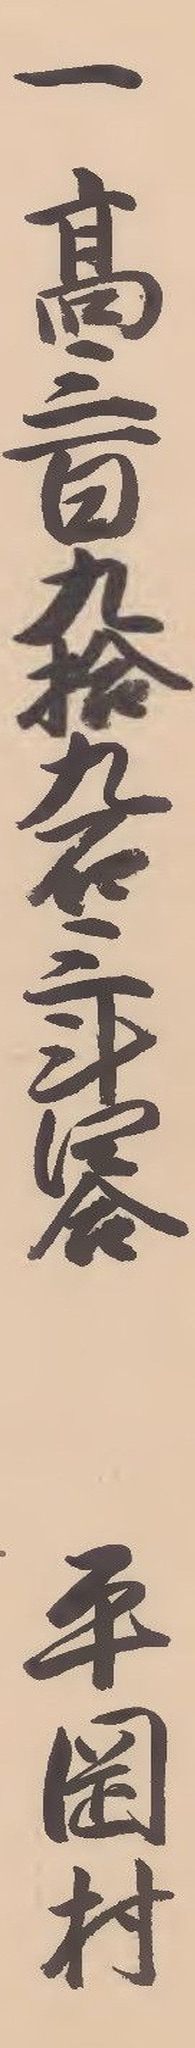一高三百九拾九石三斗四合平岡村
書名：出羽国郷帳　５
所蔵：国立公文書館 National Archives of Japan
